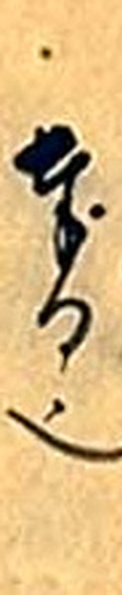奉る也
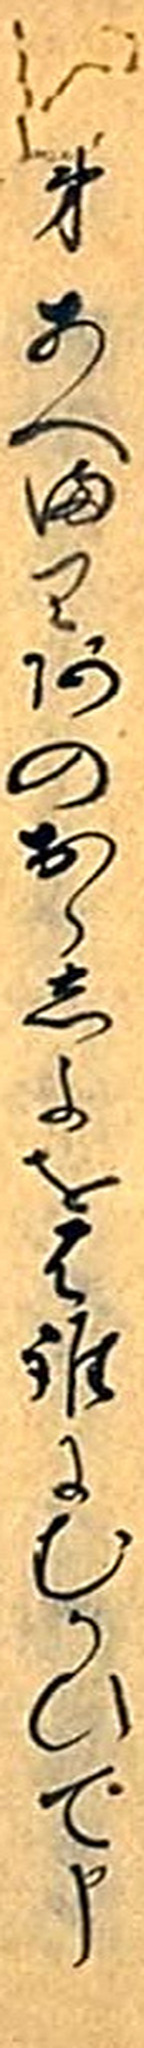弟あへまりあのおらしよをは誰にむかひて申
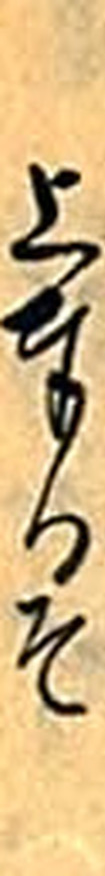上奉るそ
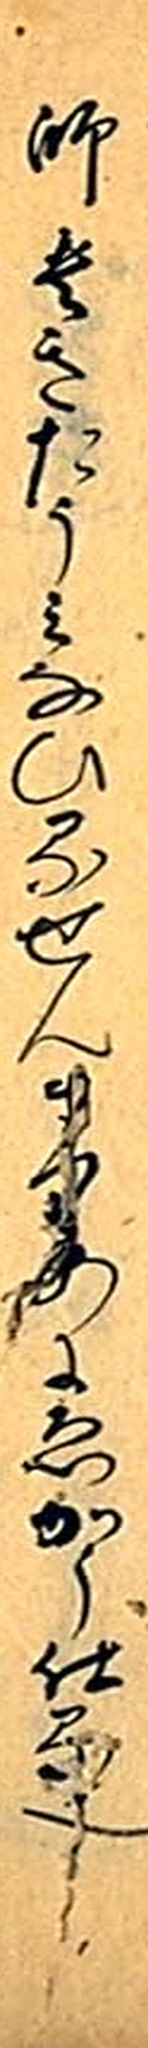師貴きたうみなひるせんまりあにゑかう仕る也
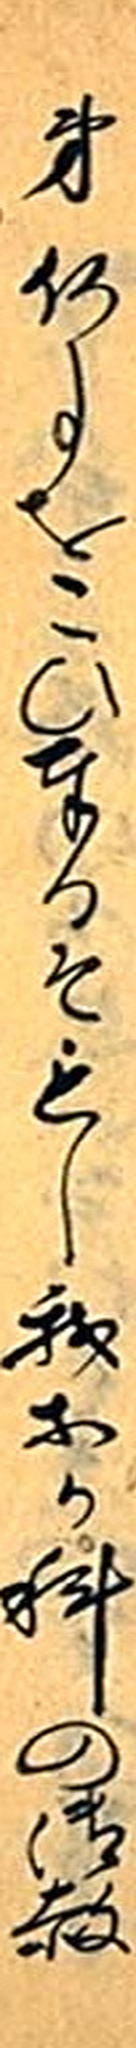弟何事をこひ奉るそもし我等か科の御赦
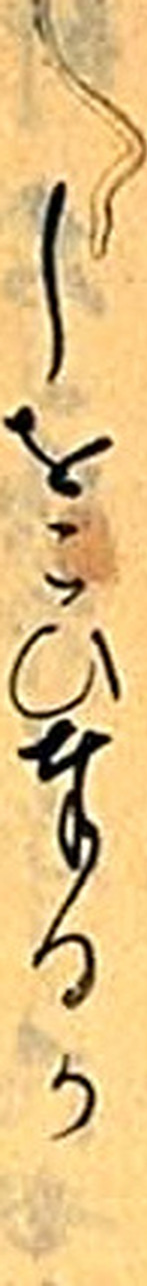しをこひ奉るか
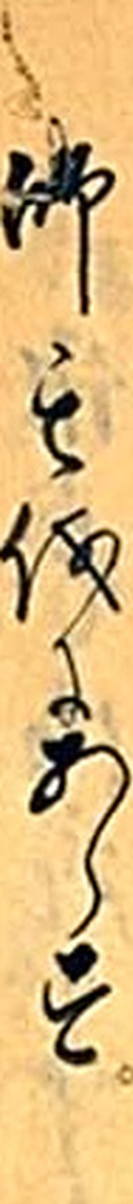師其儀にあらす
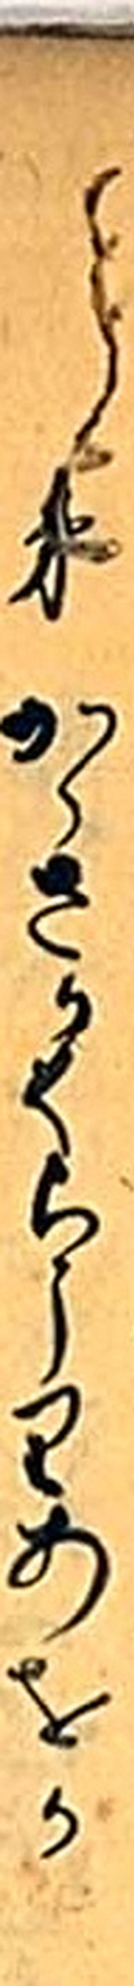弟からさかくらうりあをか
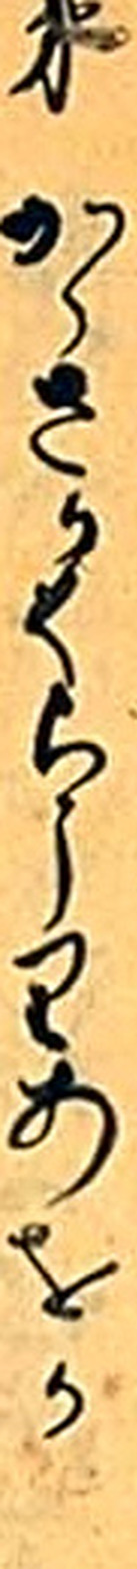弟からさかくらうりあをか
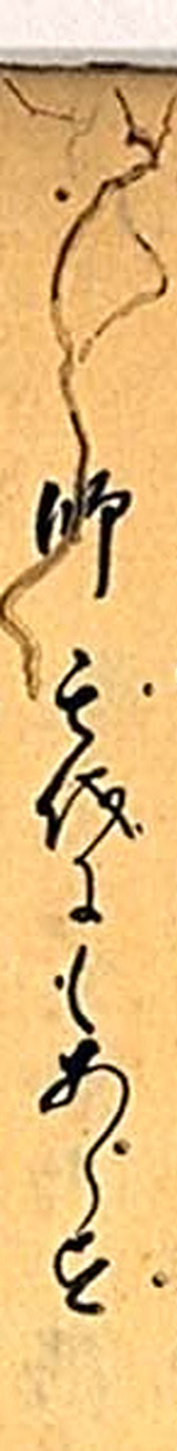師其儀にもあらす
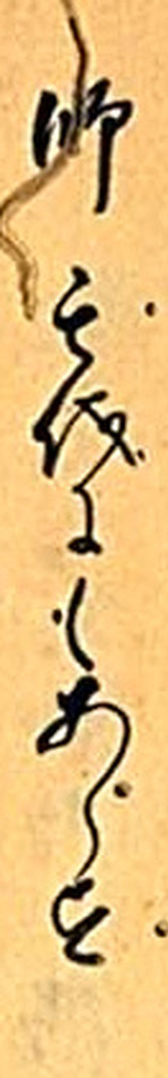師其儀にもあらす
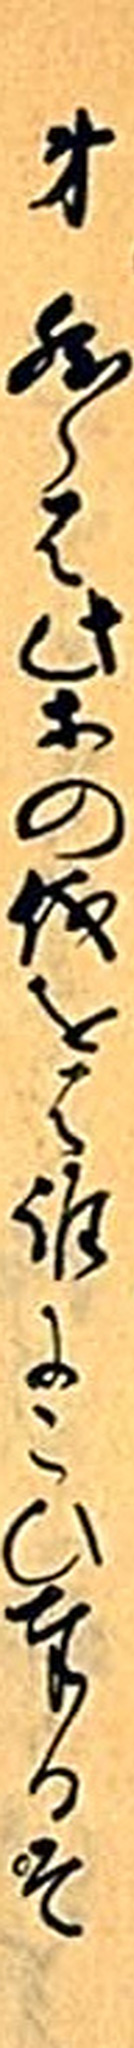弟然らは此等の儀をは誰にこひ奉るそ
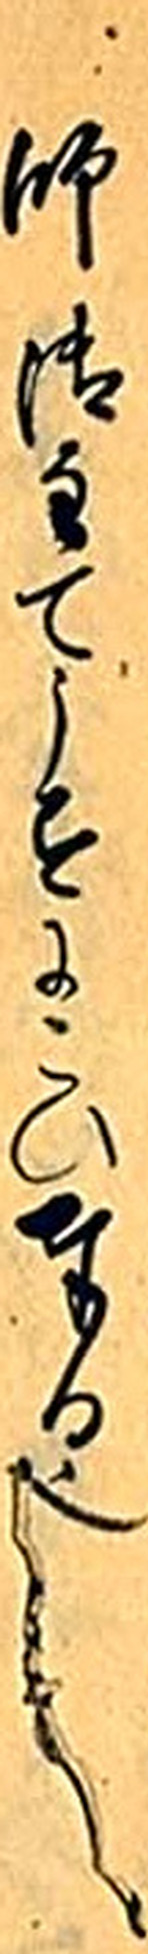師御主てうすにこひ奉る也
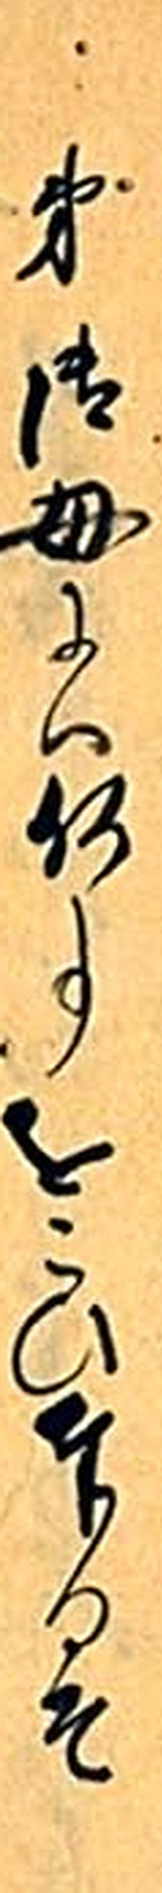弟御母には何事をこひ奉るそ
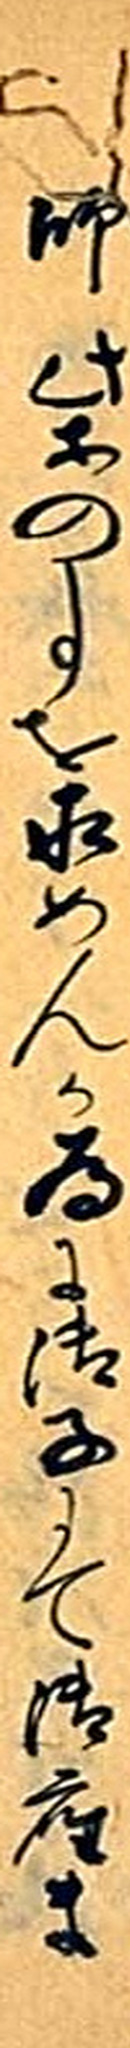師此等の事を求めんか為に御子にて御座ま
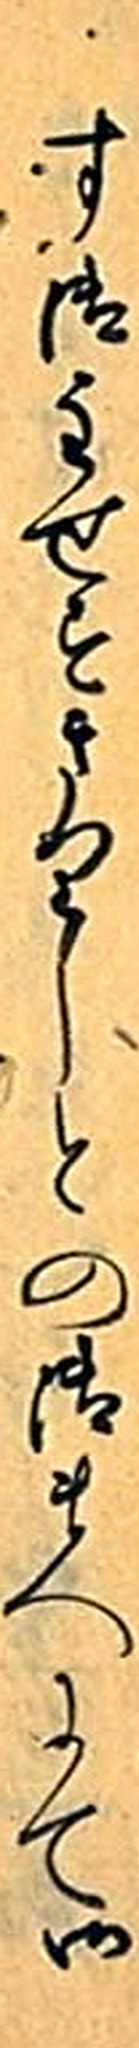す御主せすきりしとの御まへにて御
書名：ドチリナ・キリシタン
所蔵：東京大学総合図書館 / General Library in the University of Tokyo
